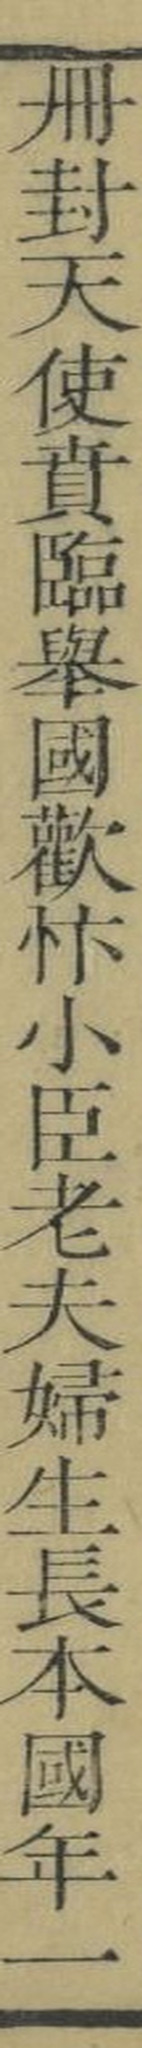冊封天使賁臨擧國歡忭小臣老夫婦生長本國年一
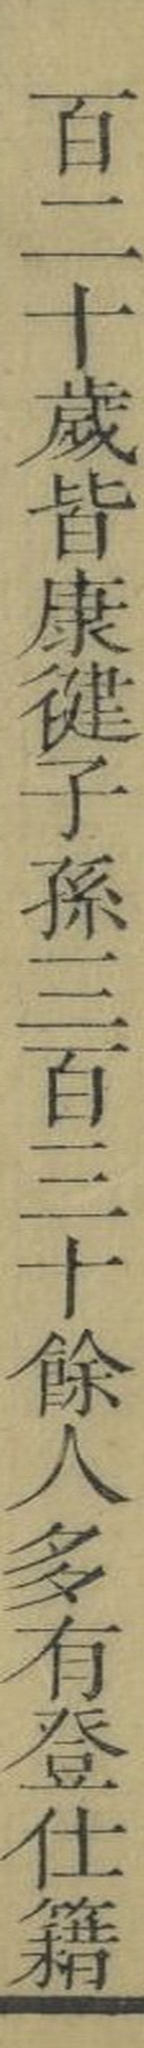百二十歲皆康徤子孫三百三十餘人多有登仕籍
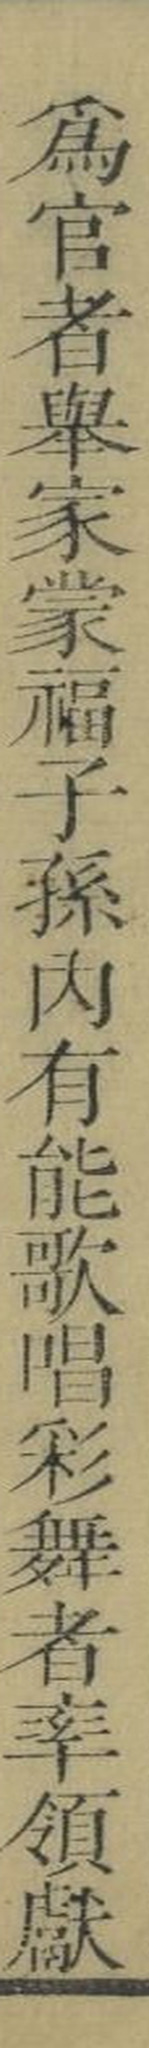爲官者擧家蒙福子孫内有能歌唱彩舞者率領獻
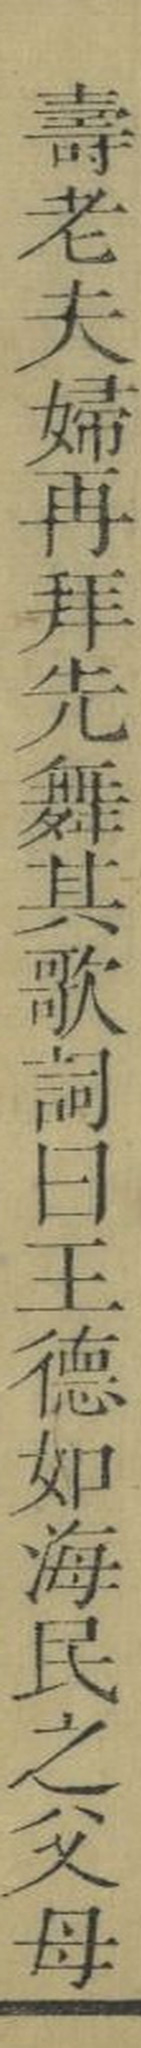壽老夫婦再拜先舞其歌詞曰王德如海民之父母
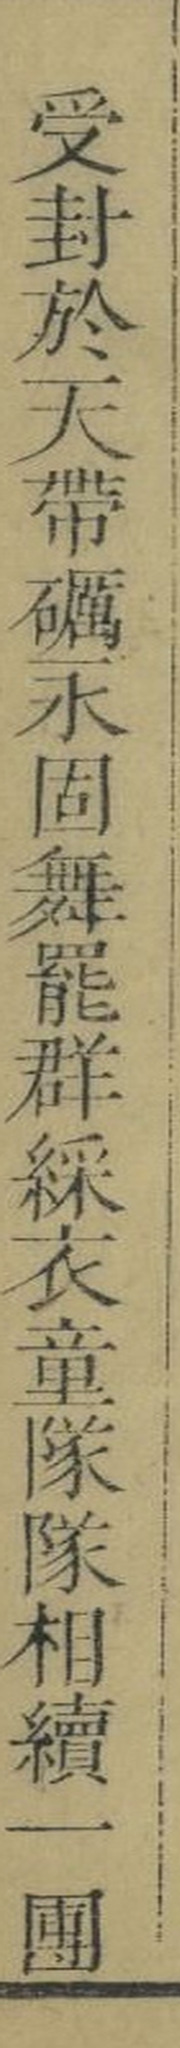受封於天帶礪永固舞罷群綵衣童隊隊相續一團

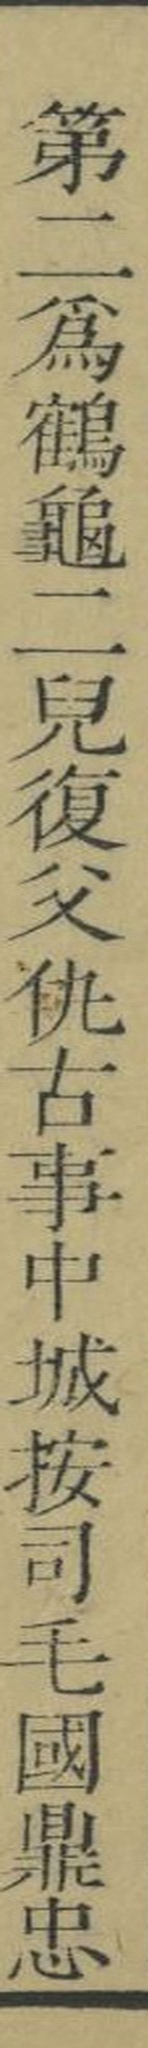第二爲鶴龜二兒復父仇古事中城按司毛國鼎忠
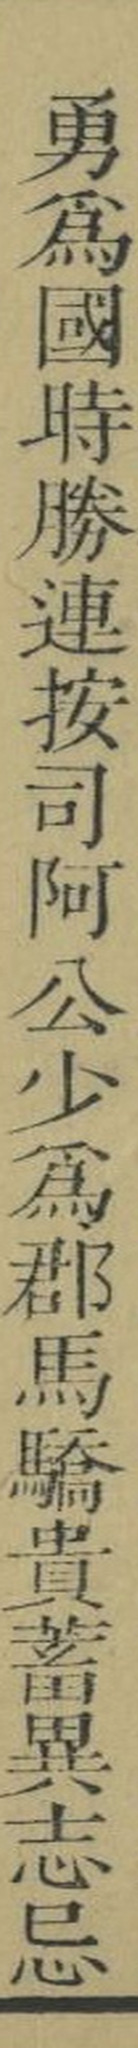勇爲國時勝連按司阿公少爲郡馬驕貴蓄異志忌
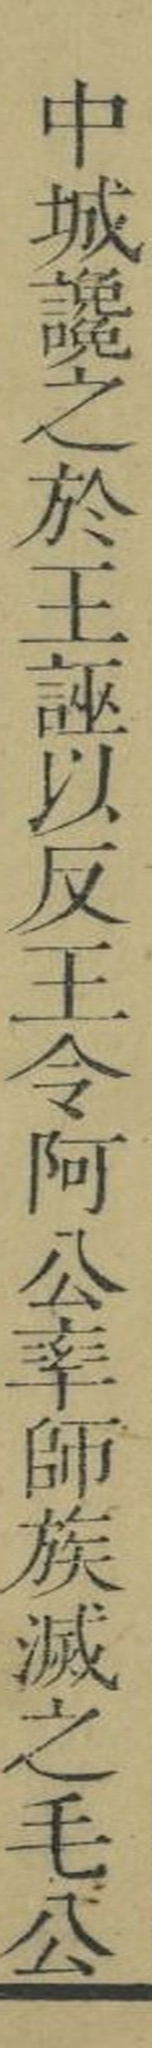中城讒之於王誣以反王令阿公率師族滅之毛公
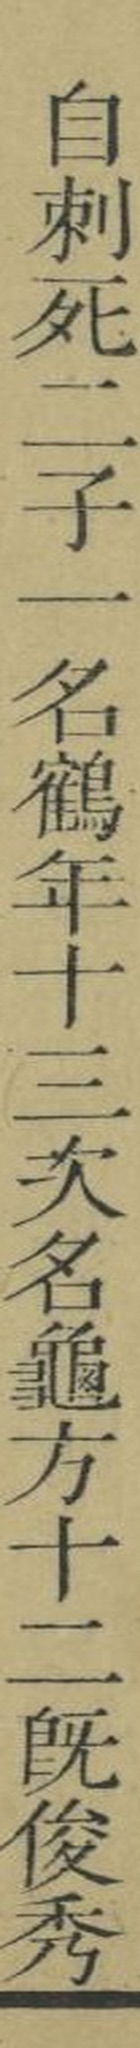自刺死二子一名鶴年十三次名龜方十二既俊秀
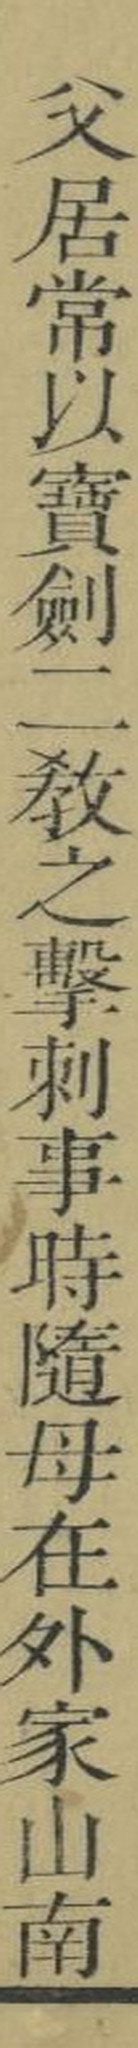父居常以寶劍二敎之擊刺事時隨母在外家山南
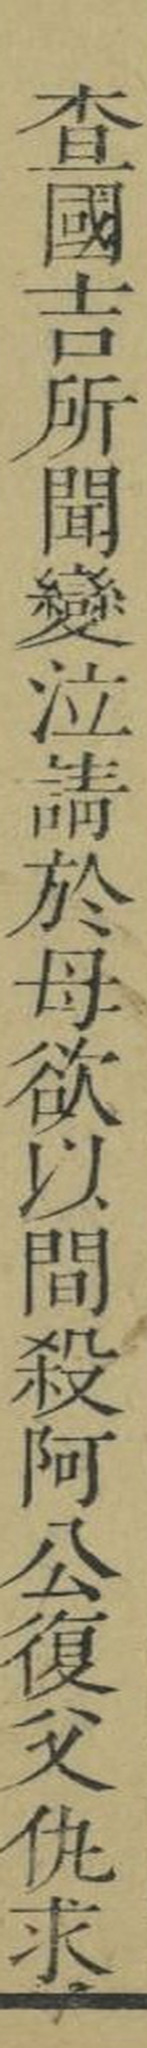査國吉所聞變泣請於母欲以間殺阿公復父仇求
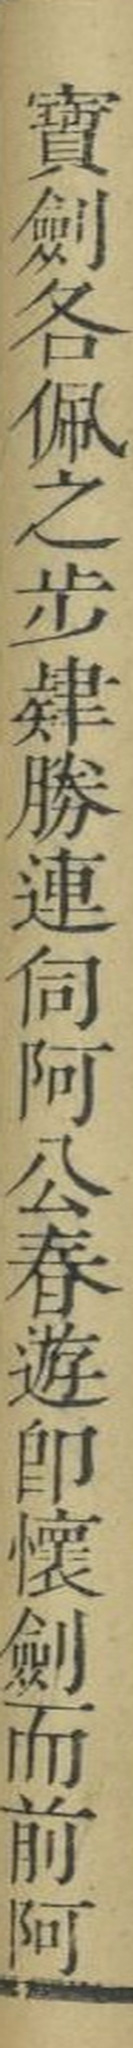寶劍各佩之步肄勝連伺阿公春遊卽懷劍而前阿
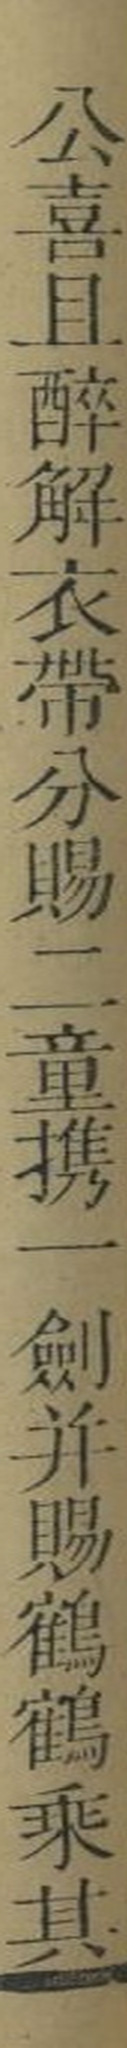公喜且醉解衣帶分賜二童携一劍并賜鶴鶴乘其
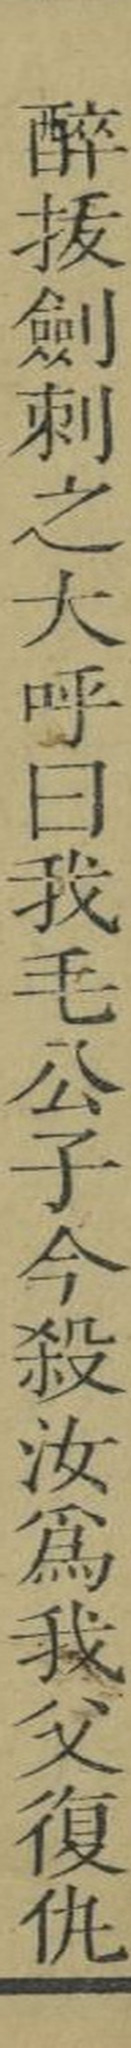醉㧞劍刺之大呼曰我毛公子今殺汝爲我父復仇
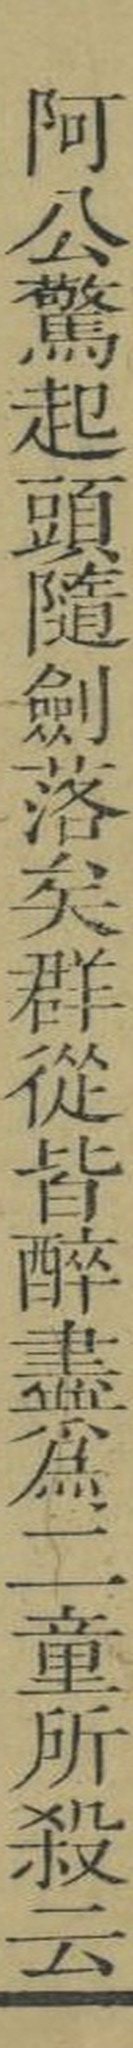阿公驚起頭隨劍落矣群從皆醉盡爲二童所殺云
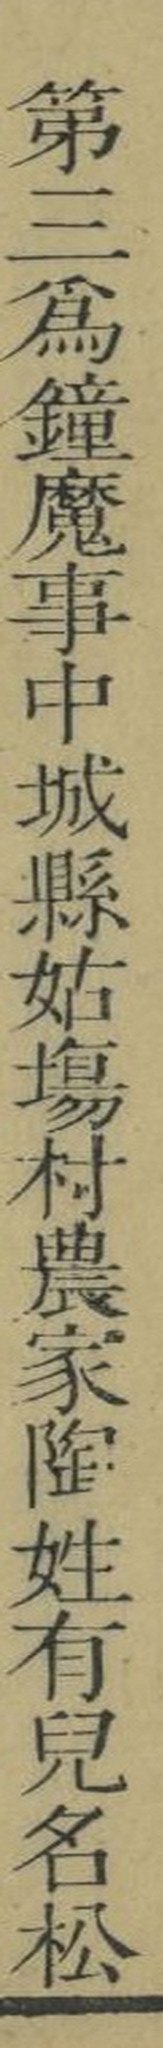第三爲鐘魔事中城縣姑塲村農家陶姓有兒名松
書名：中山伝信録 巻二
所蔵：University of the Ryukyus Library
